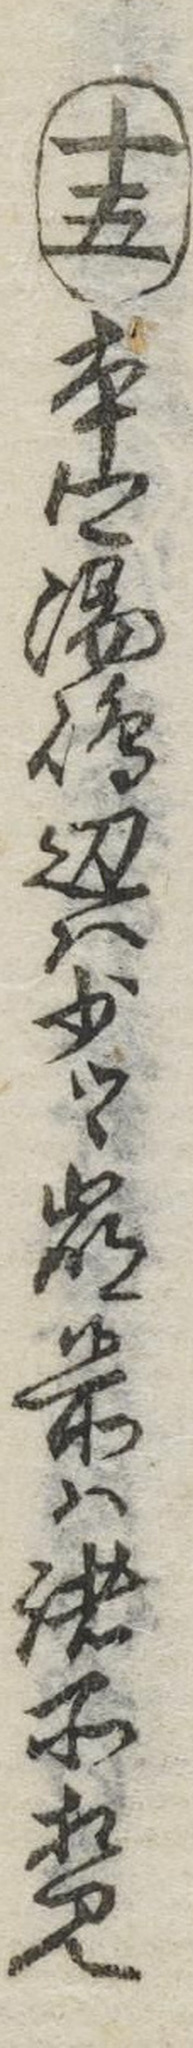十五本郷湯嶋辺は少ツヽ崩候所ハ諸所相見
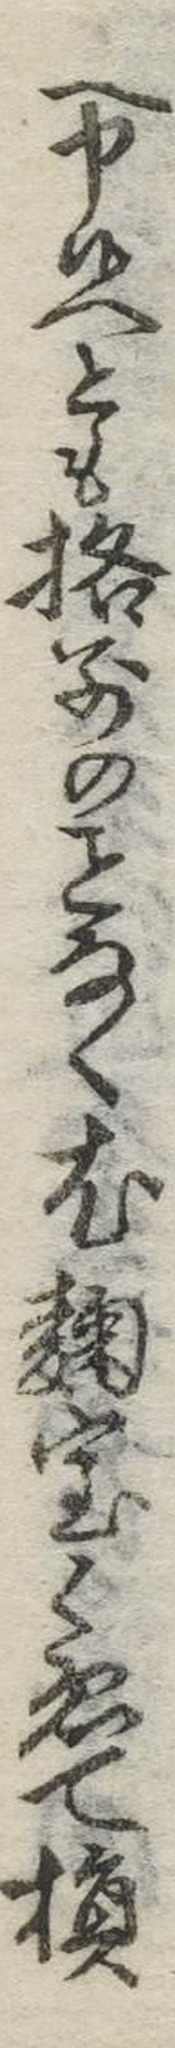へ申候へとも格別のことなく尤麹室くゑて損
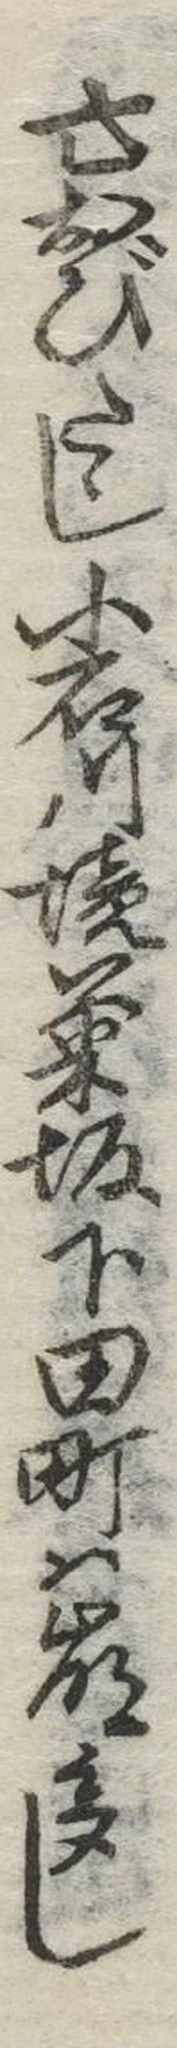亡おびたゝし小石川境菊坂下田町ハ崩多し
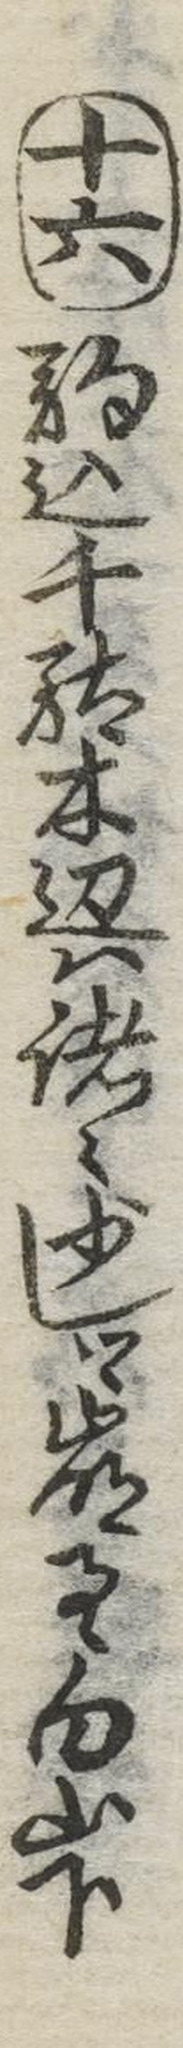十六駒込千駄木辺ハ諸〻少しツヽ崩るゝ白山下
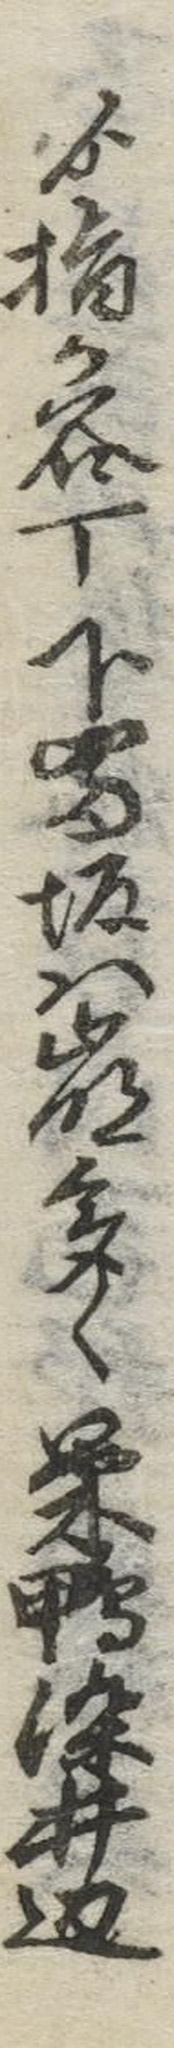ゟ指ケ谷丁下冨坂ハ崩多く巣鴨染井辺
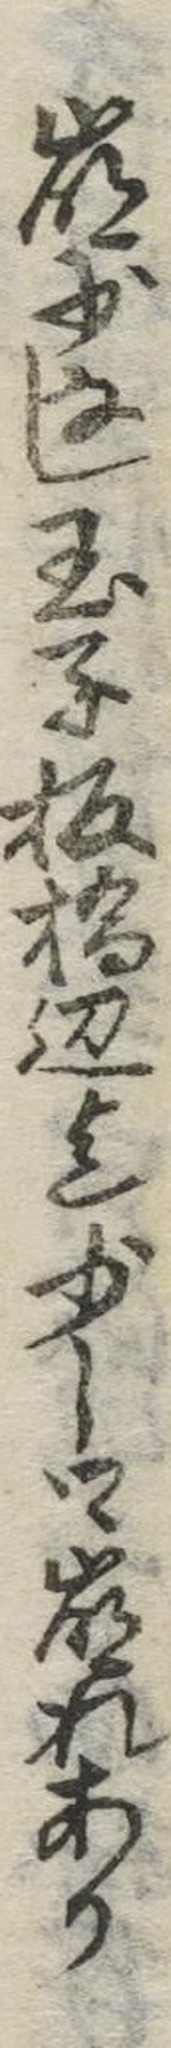崩少なし王子板橋辺迄少しツヽ崩れあり
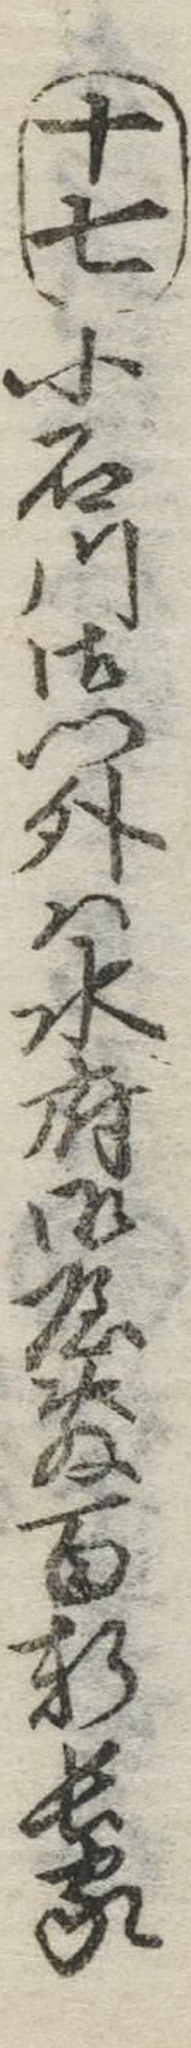十七小石川御門外ハ水府御屋敷百軒長家
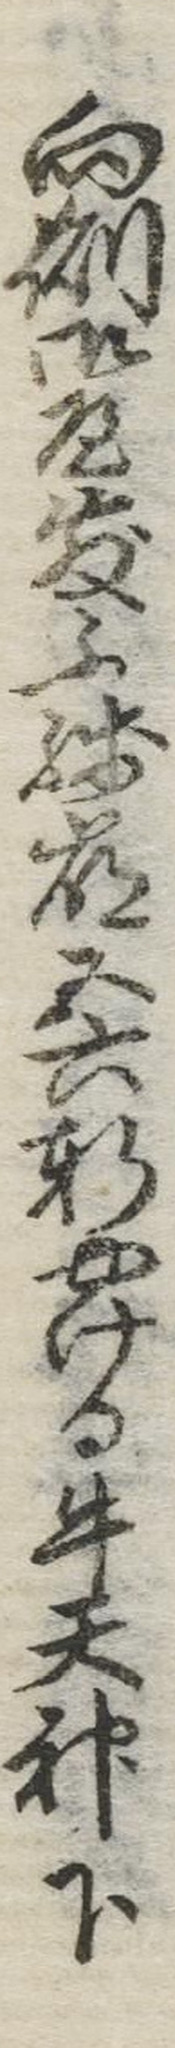向側御屋敷不残崩五六軒やける牛天神下
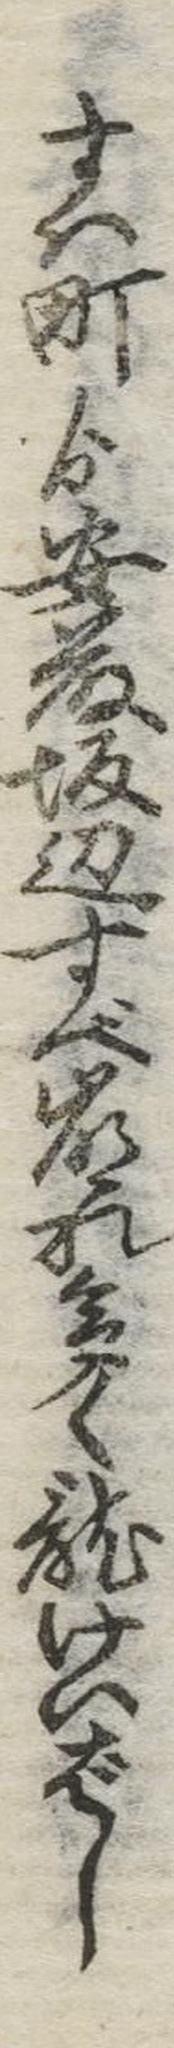すハ町ゟ安藤坂辺すべ崩れ多く龍けいばし
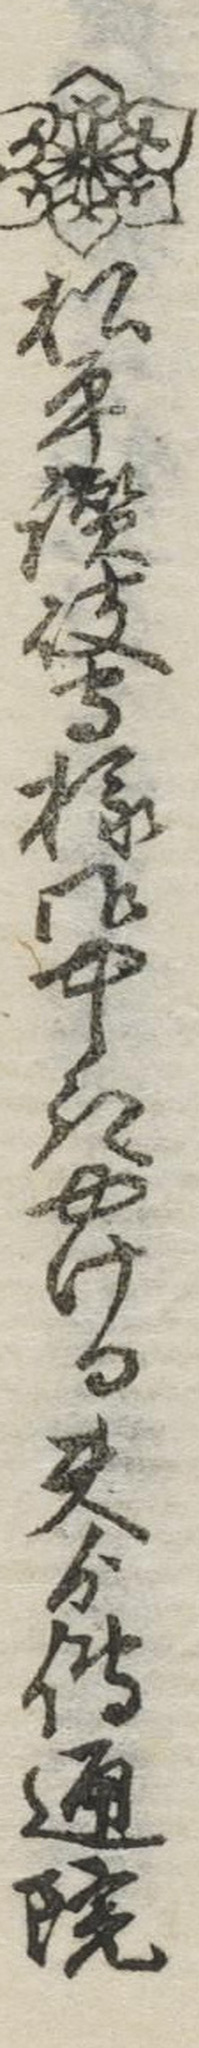松平讃岐守様御やしきやける夫ゟ傳通院
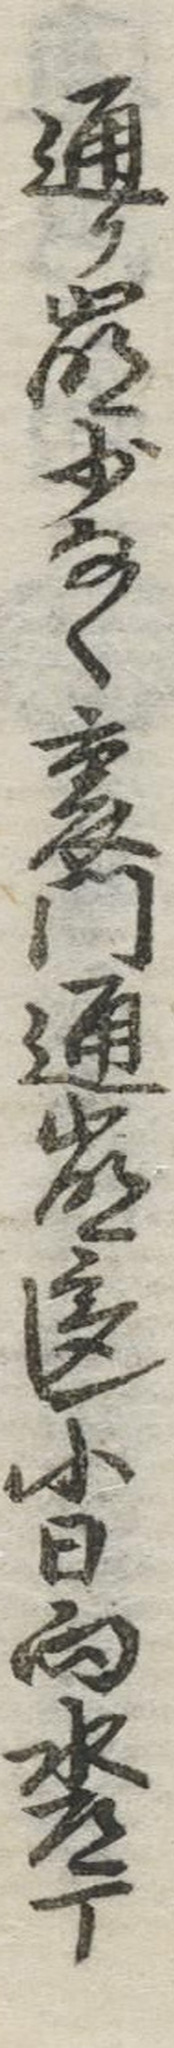通り崩少なく裏門通崩多し小日向水道丁
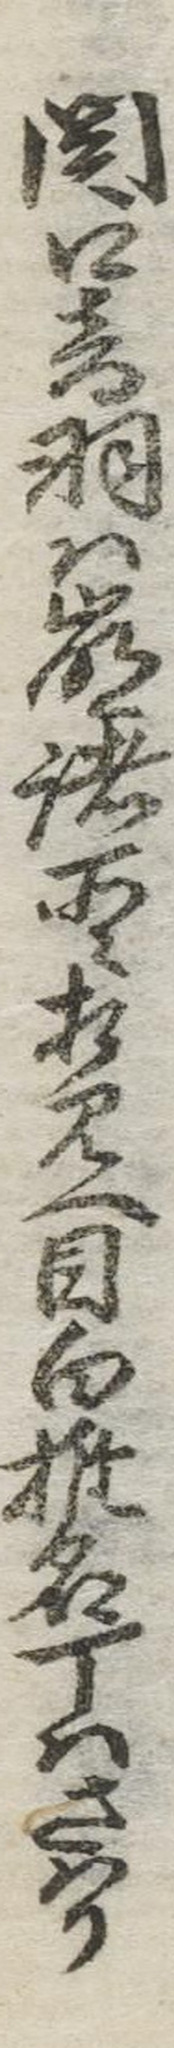関口音羽ハ崩諸所ニ相見へ目白椎名丁ハさハり
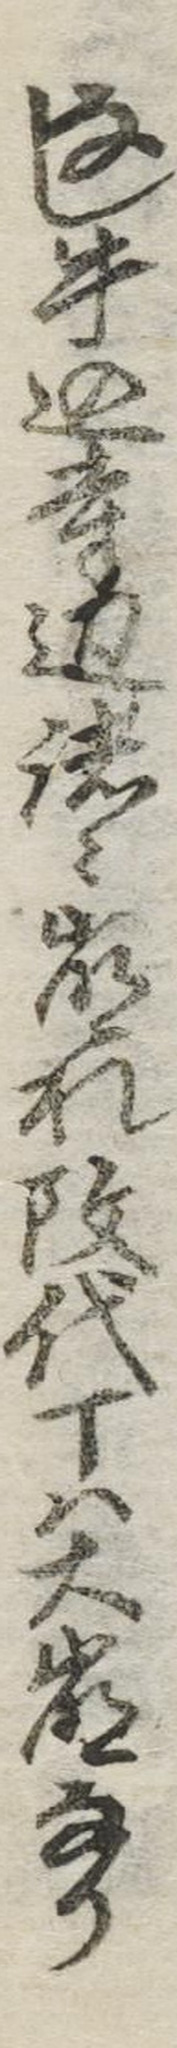なし牛込寺辺諸〻崩れ改代丁ハ大崩なり
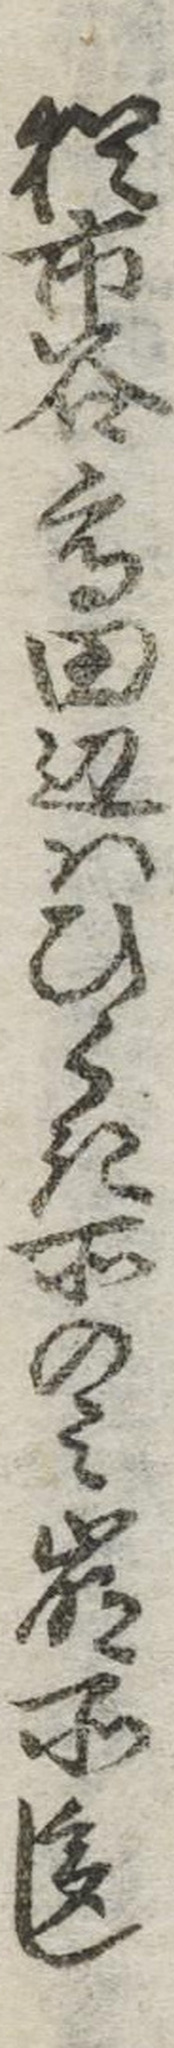猶市谷高田辺ハひくき所のミ崩所多し
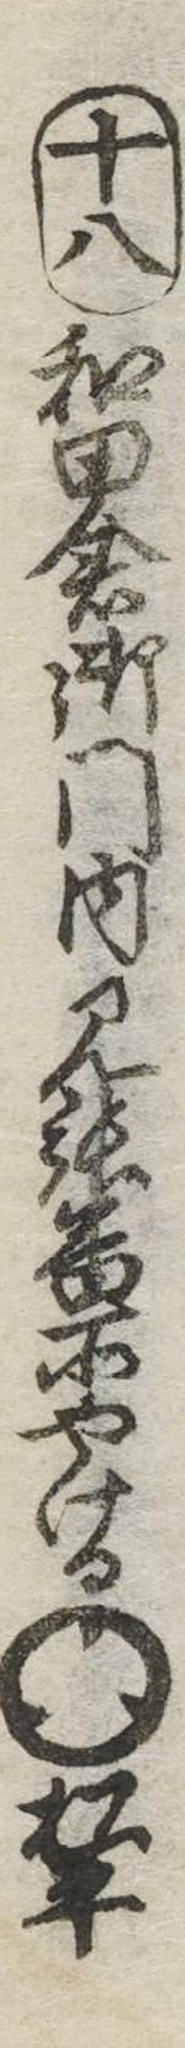十八和田倉御門内見張番所やける松平

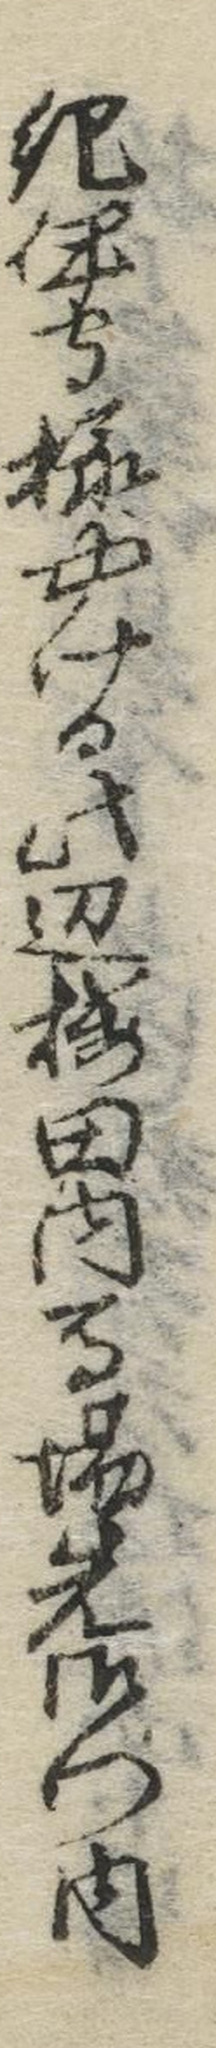紀伊守様やける此辺桜田門馬場先御門内
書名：江戸御屋鋪方町方共　地震類焼場所巨細書之寫　潰家潰土蔵共取調附街道筋近在迄
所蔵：東京大学地震研究所図書室 Earthquake Research Institute Library, The University of Tokyo, JAPAN
